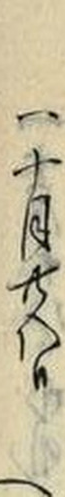一十月廿八日
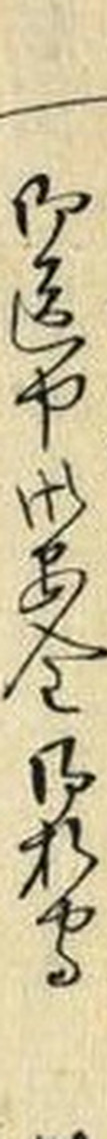御道中御安全御札守
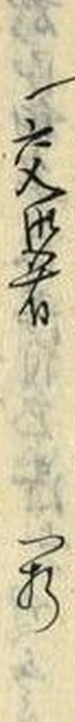交御肴一折
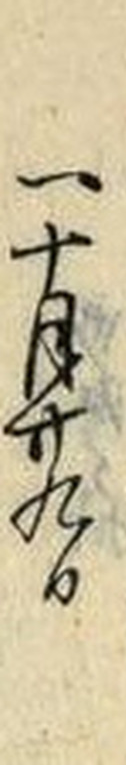一十月廿九日
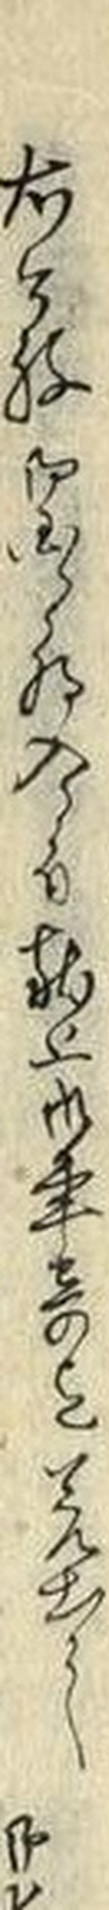右今般御国へ被為入候ニ付献上御車寄迄差上之
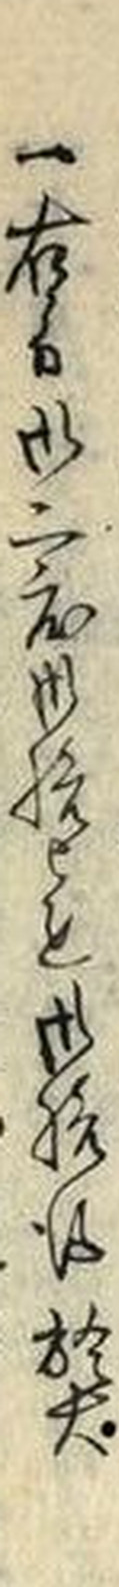一右ニ付御二度御膳被進御膳後於大
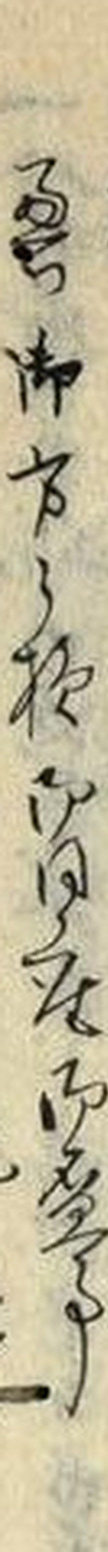奥御方々様御同座御盃事
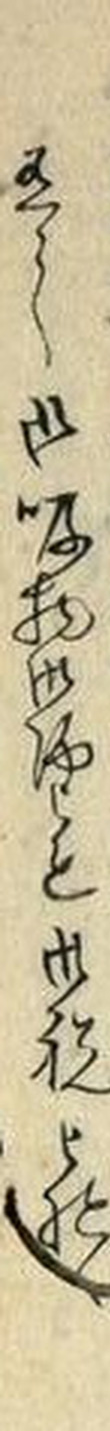有之御吸物御酒被進御祝被遊候

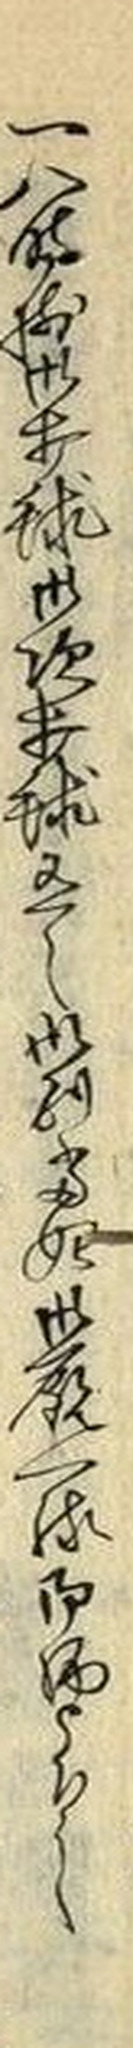一八時揃御打毬御次打毬有之御別当始御厩一統御酒被下之
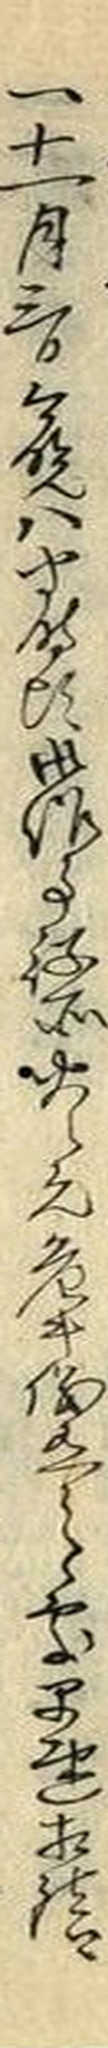一十一月三日今晩八半時頃御作事役所火之元危キ儀有之候処早速相鎮候
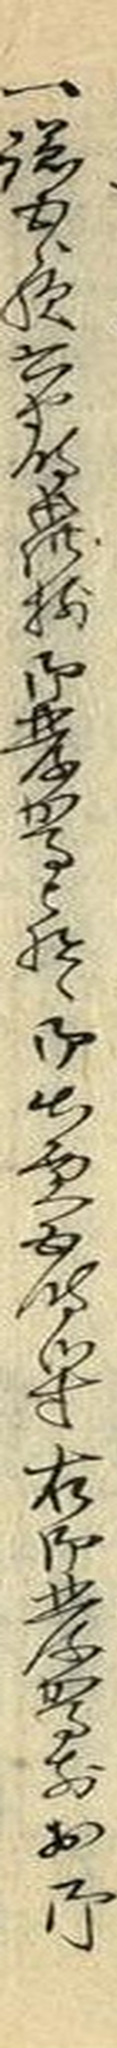一謙五郎様六半時御供揃御発駕被遊候御出殿五時弐寸右御発駕前於御
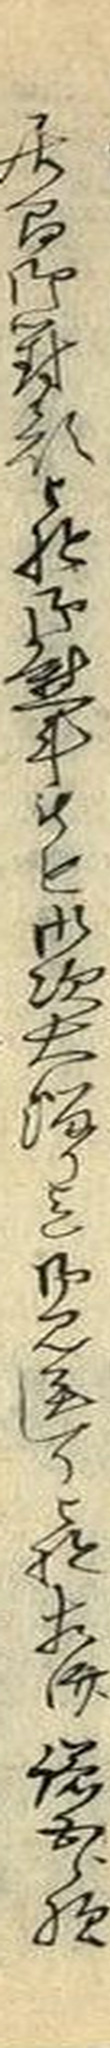居間御対顔被遊御熨斗被進御次大溜り迄御見送り被遊相済謙五郎様
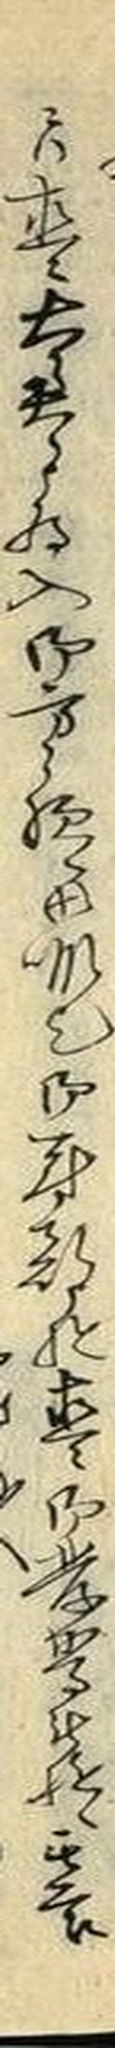ニハ直ニ大奥被為入御方々様へ御暇迄御対顔被遊直ニ御発駕被遊候其節
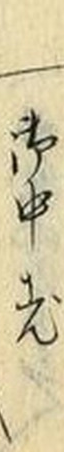御中老
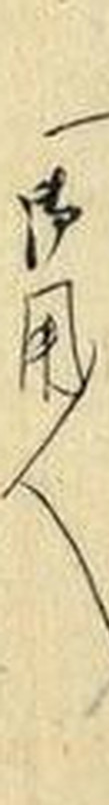御用人
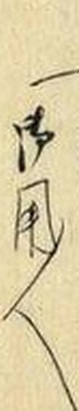御用人
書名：少傅日録抄（斉承付側向頭取日記、在府）
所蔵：福井県文書館 Fukui Prefectural Archives
